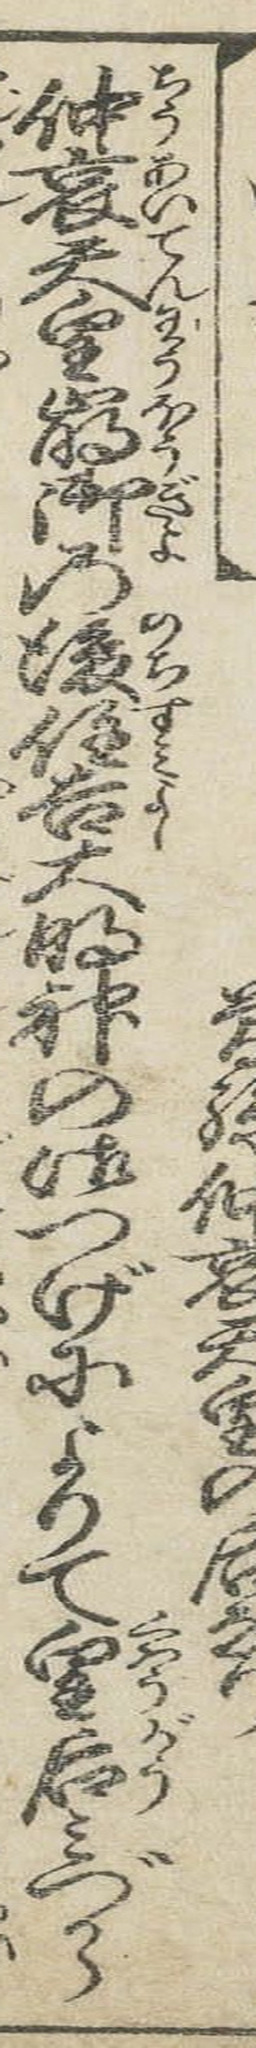仲哀天皇崩御の後住吉大明神の御つげによりて皇后みづから
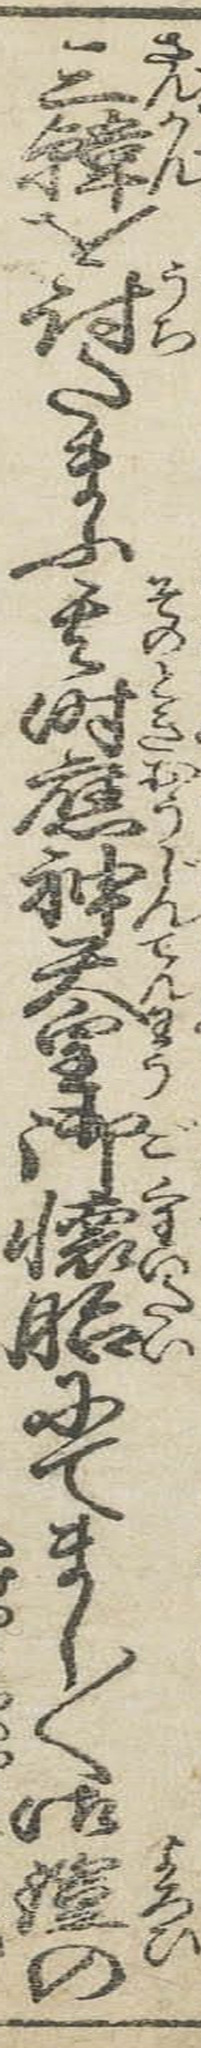三韓を討たまふ其時応神天皇御懐胎にてまし〳〵御鎧の
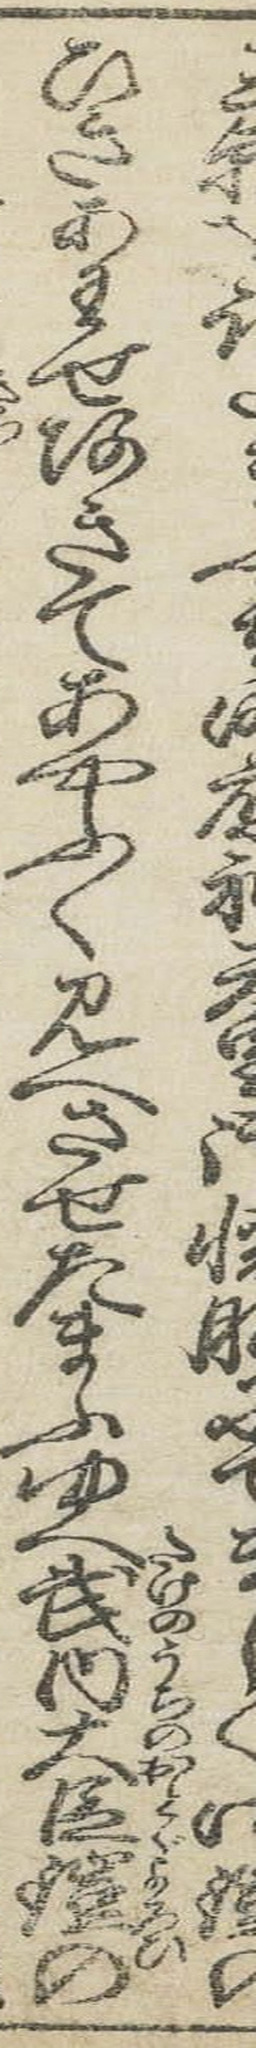ひきあわせあきてあやふく見へさせたまふゆへ武内大臣鎧の
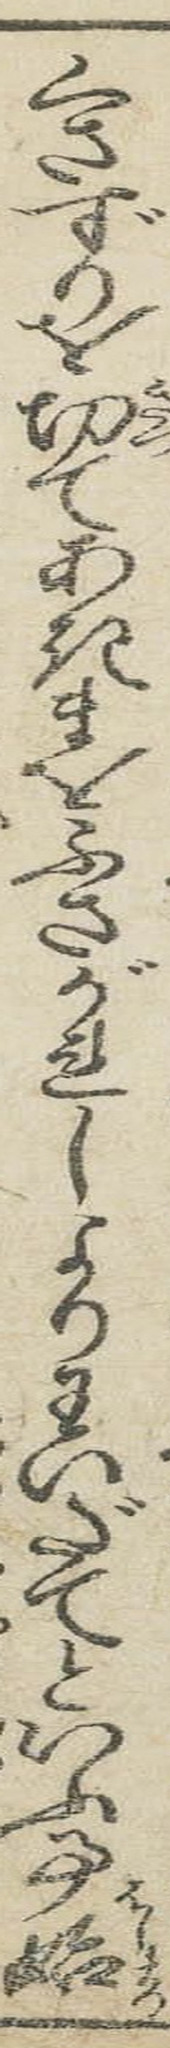くさずりを切てあきまをふさがれしよりわいだてといふ事始
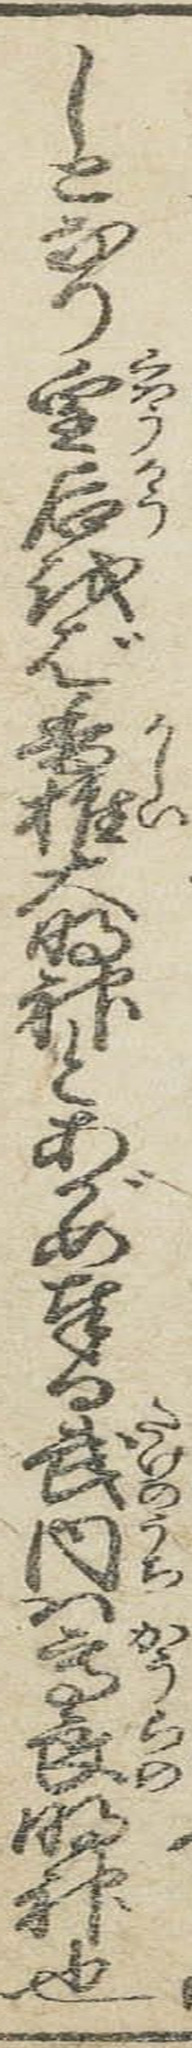しとなり皇后をば香椎大明神とあがめ奉る武内は高良明神也
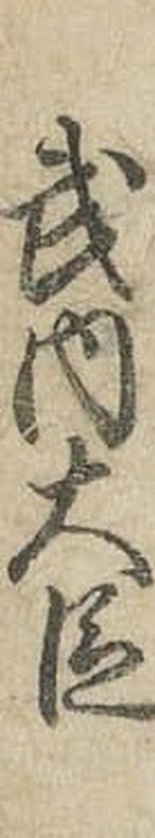武内大臣

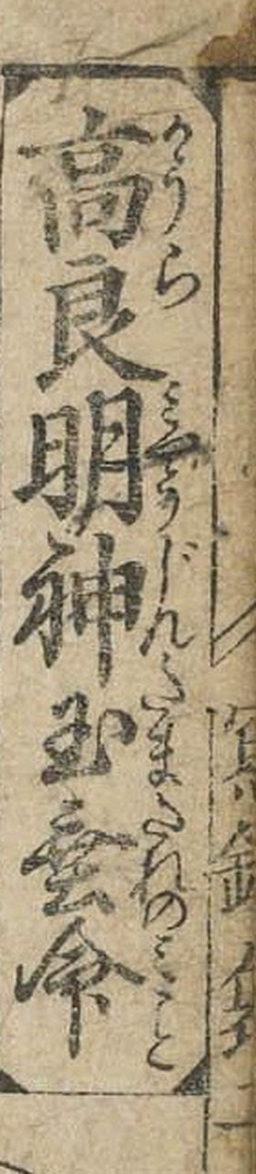高良明神玉垂命
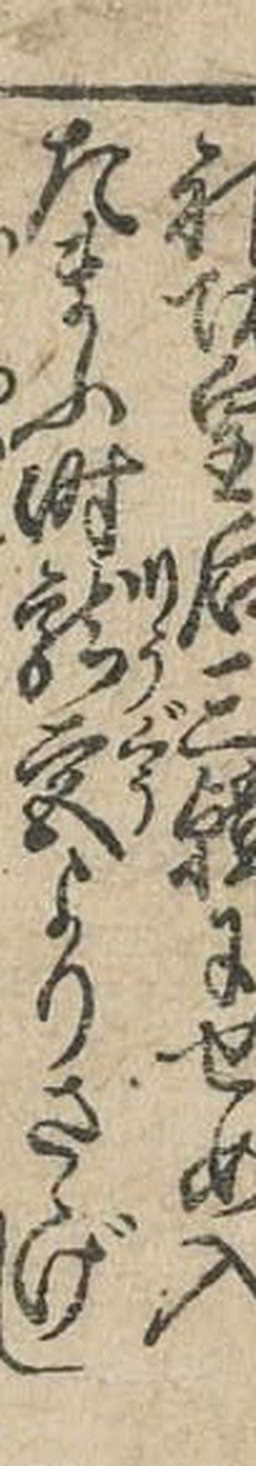たまふ時龍宮よりさゝげし
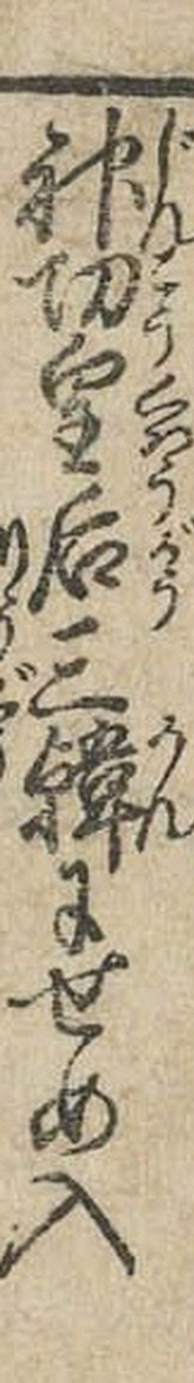神功皇后三韓にせめ入
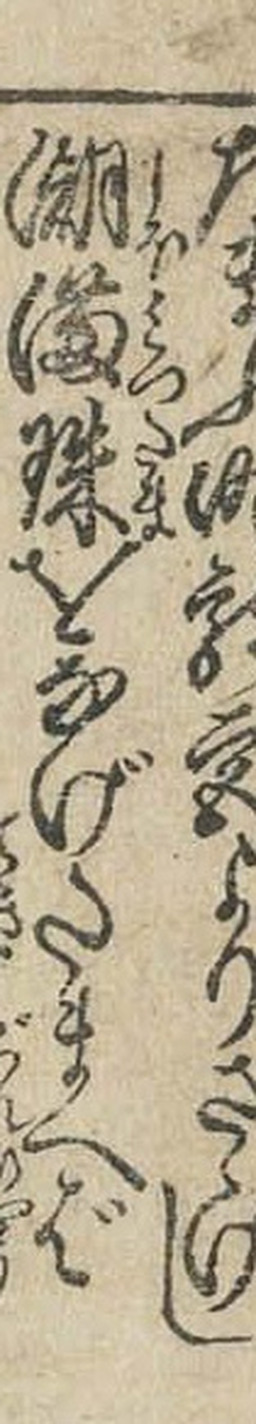潮満珠をなげたまへば
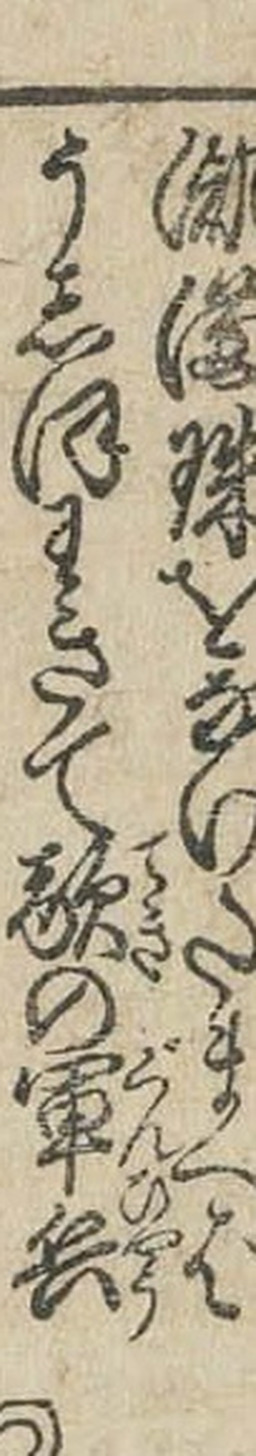うしほわきて敵の軍兵
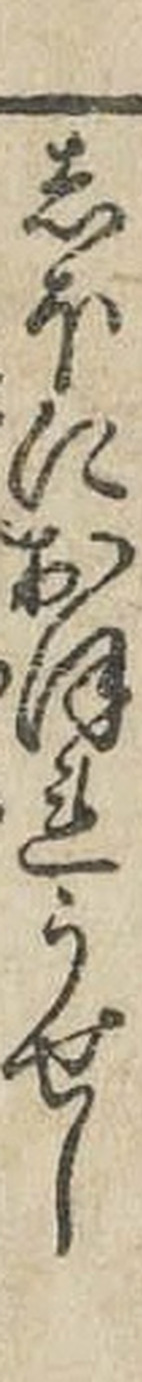しほにおほれうせし
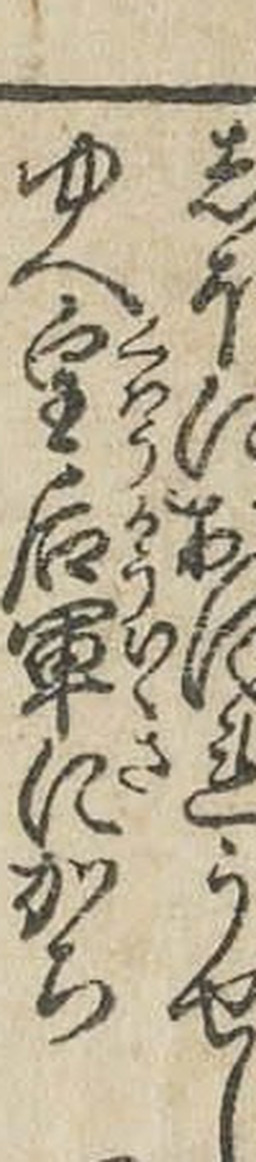ゆへ皇后軍にかち
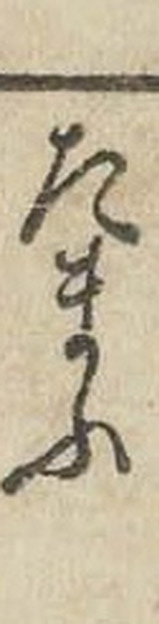たまふ
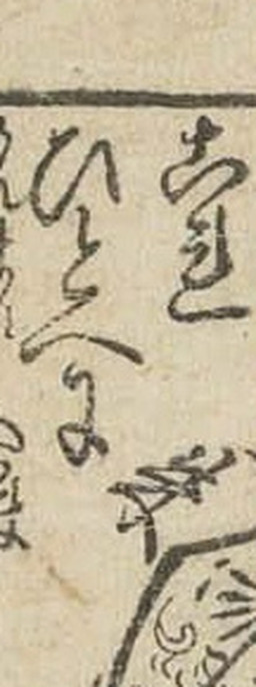ひとへに
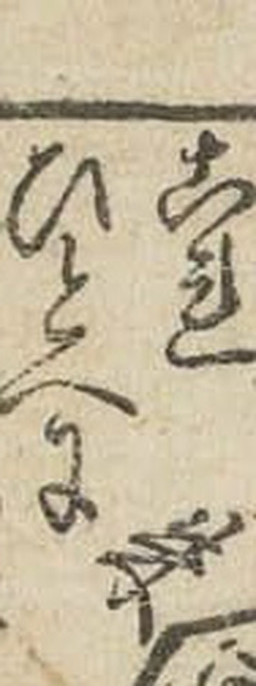ひとへに
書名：絵本写宝袋 9巻 2之巻
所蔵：東京学芸大学教育コンテンツアーカイブ
